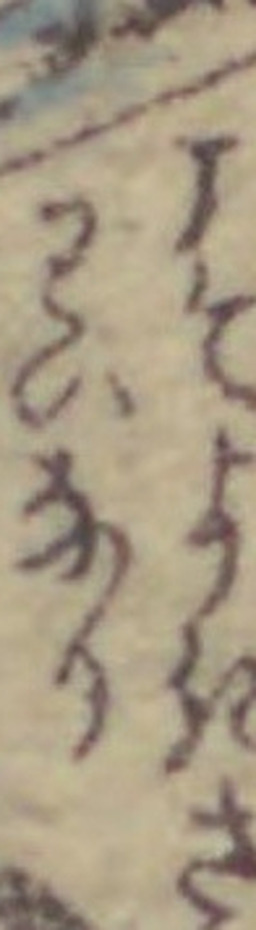わいなり
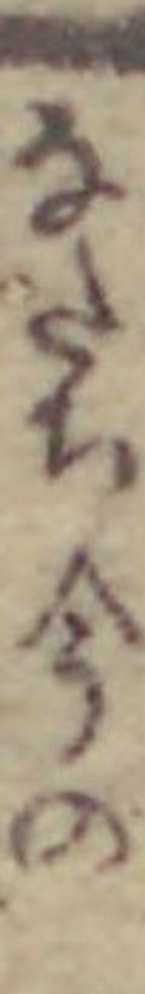なたち今の
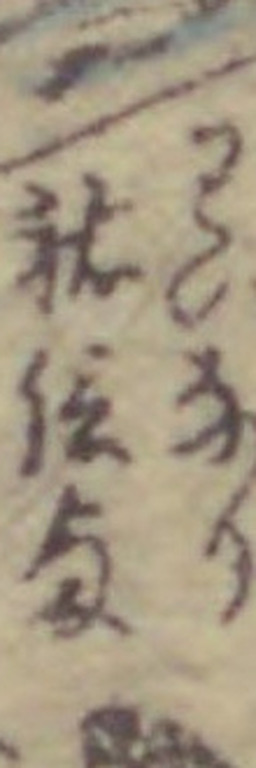祐経殿
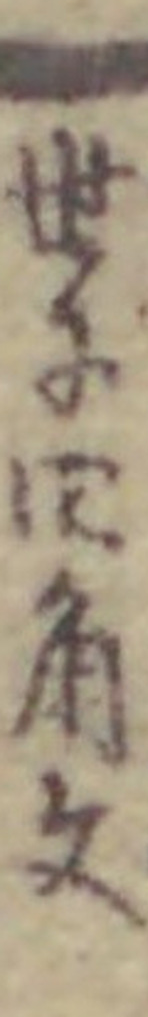世に四角文
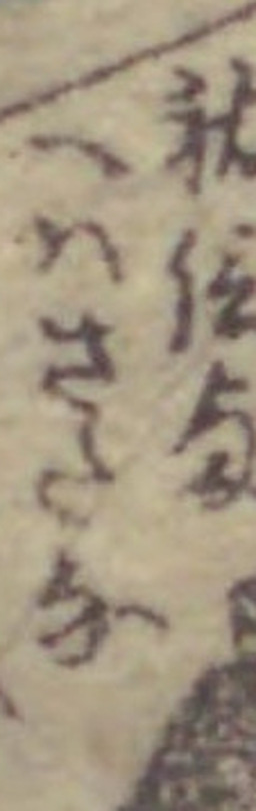へはさたな
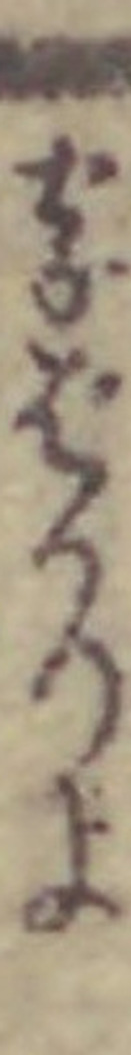字ばかりよ
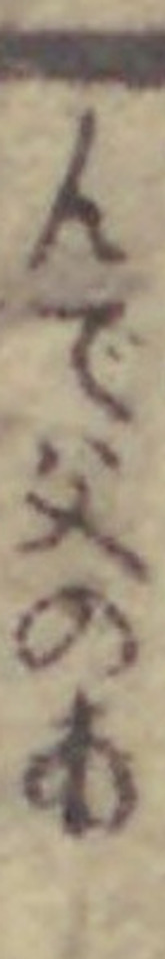んで父のあ
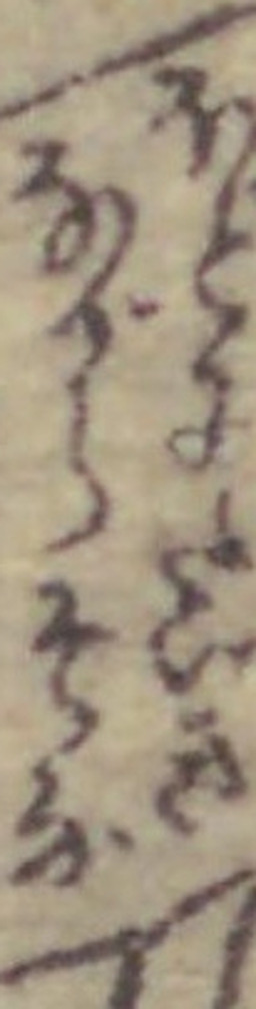ながらそな
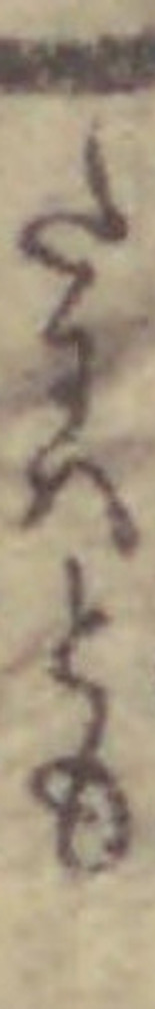たにはとも
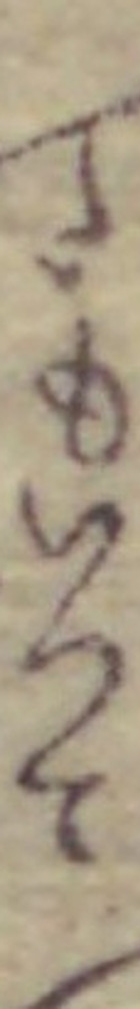たもいつて
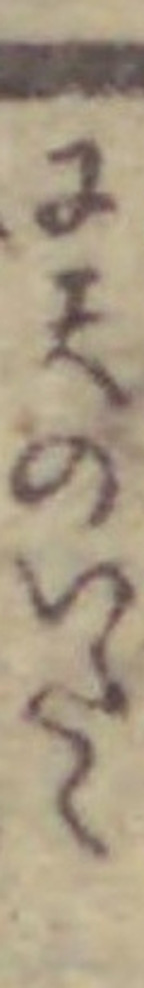に天のいたゝ
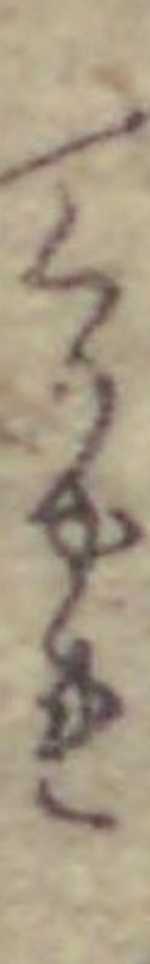くりやれ
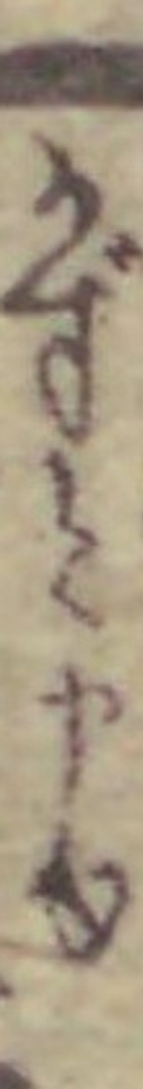かずと申由
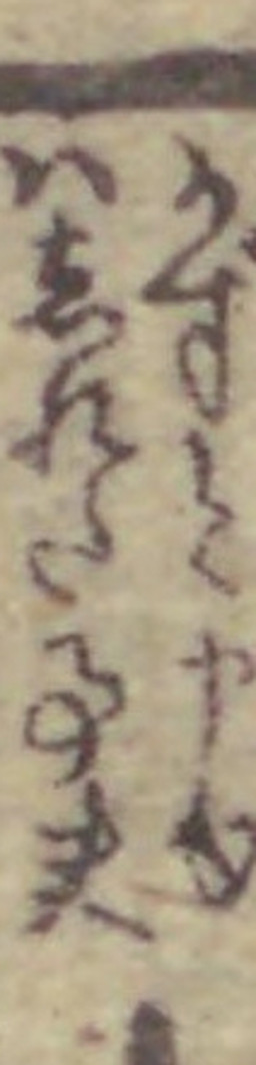はしれた事夫
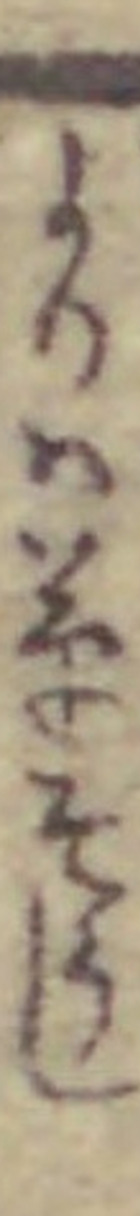よりは草そうし
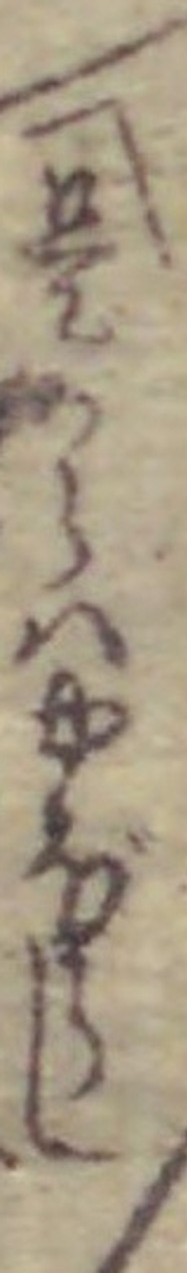「是からはやぼらし
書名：間似合嘘言曽我 3巻
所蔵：国立国会図書館 National Diet Library, JAPAN
